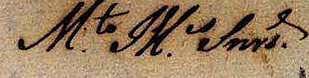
M.to Ill.es Snrs̄.
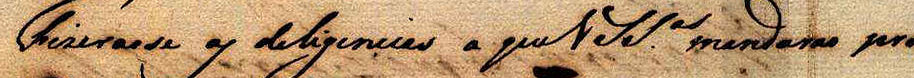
Fizeraose as deligencias a que VSS.as mandarao pro
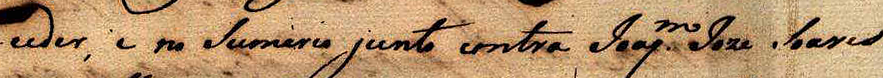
ceder, e no Sumario junto contra Ioaq.m Ioze Soares
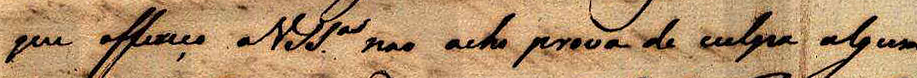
que offereço a VSS.as nao acho prova de culpa alguma
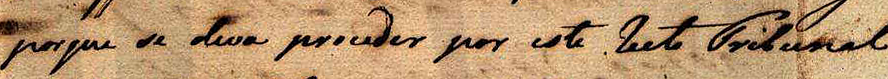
porque se deva proceder por este Recto Tribunal
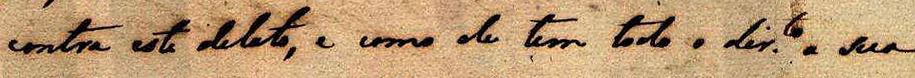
contra este delato, e como ele tem todo o dir.to a sua
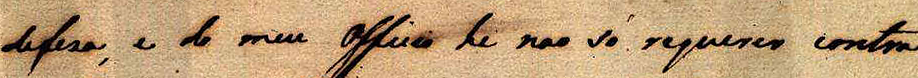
defeza, e o meu Officio de nao só requerer contra
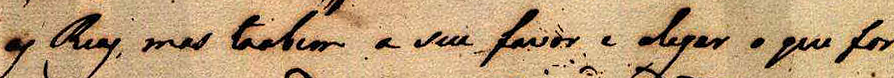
os Reos, mas taobem a seu favor e chegar o que for
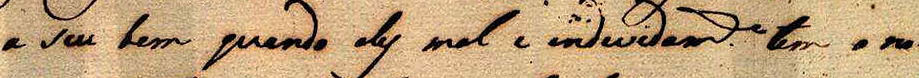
a seu bem quando eles mal e indevidam.te tem o no
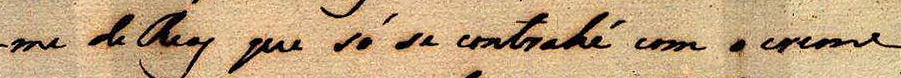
me de Reos que só se contrahé com o crime
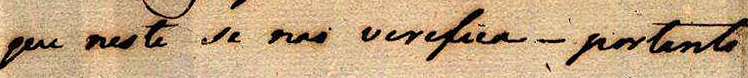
que neste se nao verefica - portanto
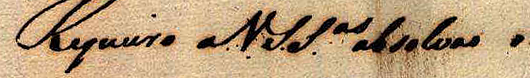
Requeiro a VS.S.as absolvao o
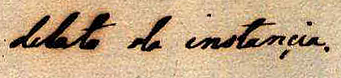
delato da instançia.
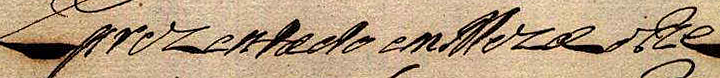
E prezentado em Meza o Re
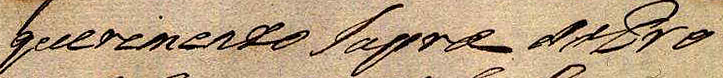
querimento Supra do Pro
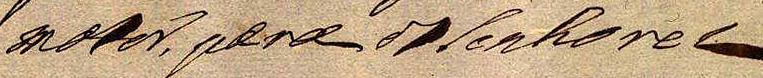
motor, para os senhores
